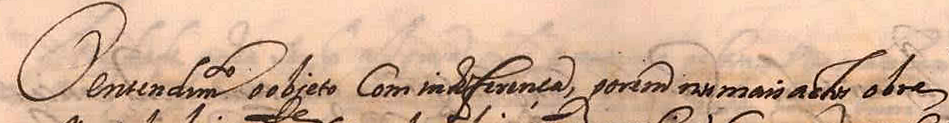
O entendim.to o objeto Com indiferença, porem nos mais actos obra
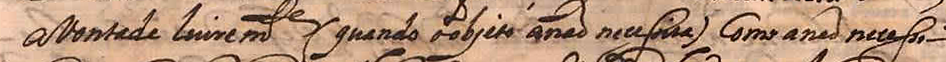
a vontade liuremte (quando o objeto a naõ necessita) Como a naõ necessi
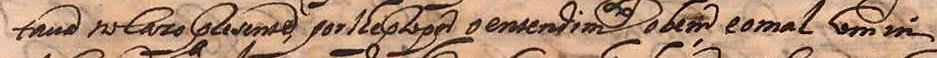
taua no Cazo pResente, por lhe pRopor o entendimto o bem, e o mal com in
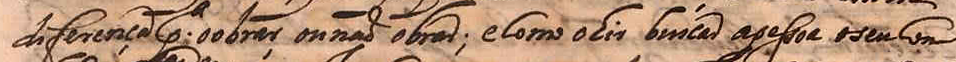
diferença p.a o obrar, ou naõ obrar; e como o hir buscar a pessoa o seu Con
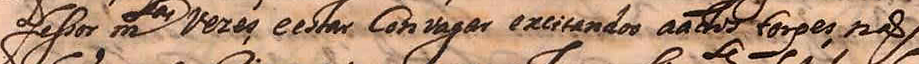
fessor mtas vezes, e estar Con vagar excitandoo a actos torpes, naõ
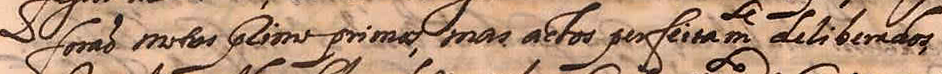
foraõ motos pRimo primos, mas actos perfeitamte deliberados,
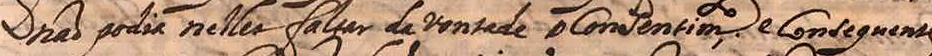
não podia nelles faltar da vontade o Consentimto, e Consequente
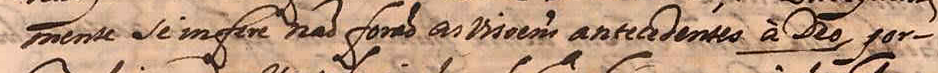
mente se infere naõ foraõ as visoens antecedentes à Deo, por
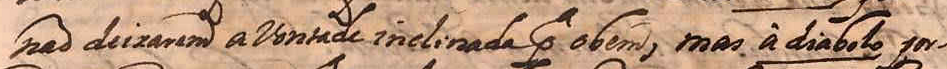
naõ deixarem a vontade inclinada pa o bem, mas à diabolo, por
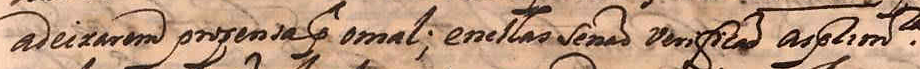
a deixarem propensa pa o mal; e nellas se naõ verificaõ as pRim.ras
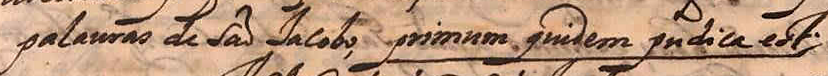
palauras de Saõ Iacobo, primum quidem judica est.
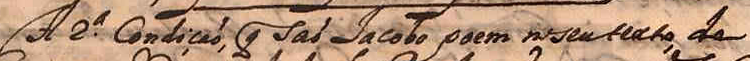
A 2.a Condiçaõ, q̄ saõ Iacobo poem no seu texto, da
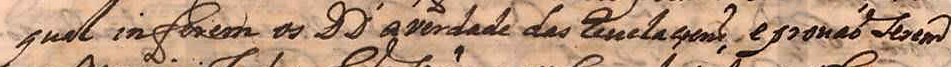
qual inferem os DD a verdade das Reuelaçoens, e prouaõ serem
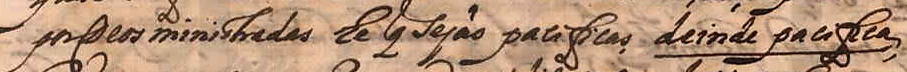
por Deos ministradas he q̄ sejão pacificas, deinde pacifica,
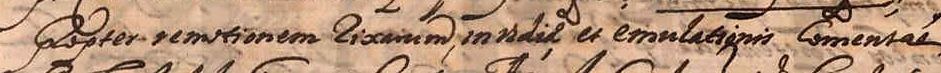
pRopter remotionem Rixarum, invidiæ et emulationis comentaõ
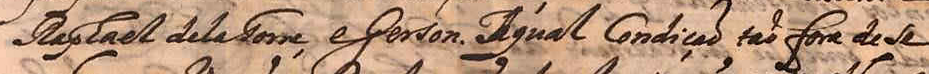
Raphael de la Torre, e Gerson. A qual Condiçaõ taõ fora de se
